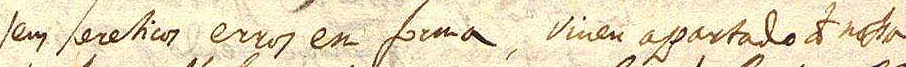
sem hereticos erros em forma, viueu apartado d̄ nossa
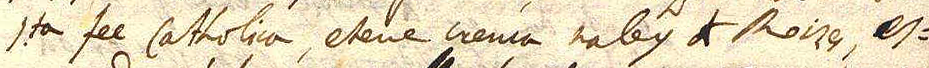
S.ta fee Catholica, e teue crença na ley d̄ Moizes, es
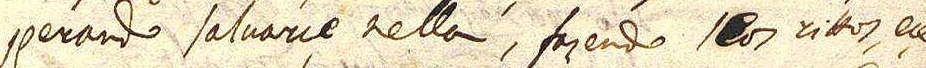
perando saluarçe nella, fazendo seos rittos, e çe
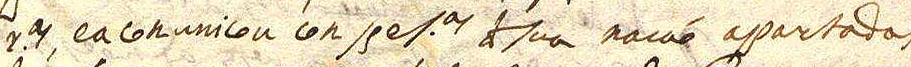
r.as, e a comunicou con pes.as d̄ sua nacaõ apartadas
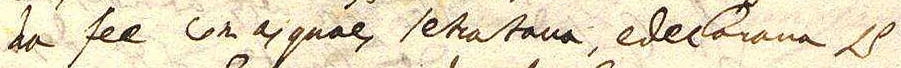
da fee com as quaes se trataua, e declaraua por
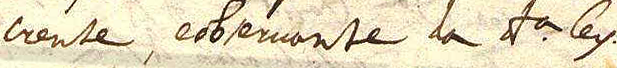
crente, e obseruante da d̄a. ley.
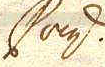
Porqto.
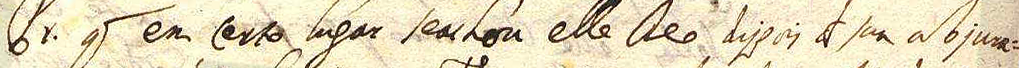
Pr. q̄ em certo lugar se achou elle Reo dipois d̄ sua abjura
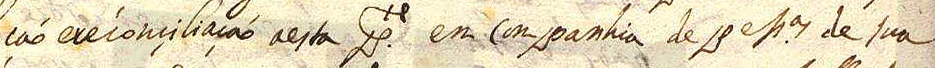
çaõ e reconçiliaçaõ a esta p.te em companhia de pess.as de sua
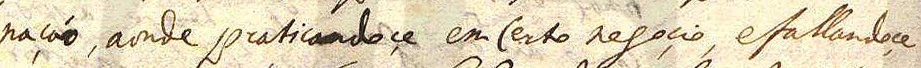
naçaõ, aonde praticandoçe em Certo negoçio, e fallandoçe
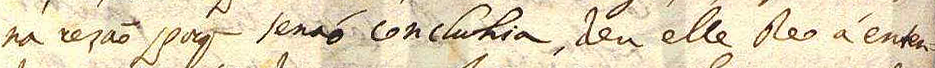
na rezaõ porq̄ se naõ concluhia, deu elle Reo a enten
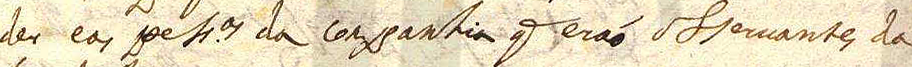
der e as pess.as da companhia q̄ eraõ obseruantes da
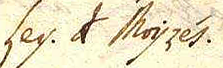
Ley. d̄ Moyzés.
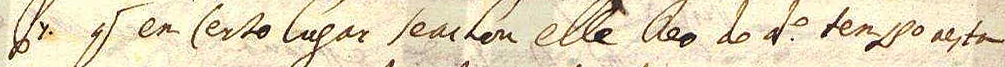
Pr. q̄ em certo lugar se achou elle Reo do d.o tempo a esta
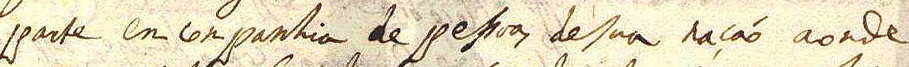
parte em companhia de pessoas de sua naçaõ aonde
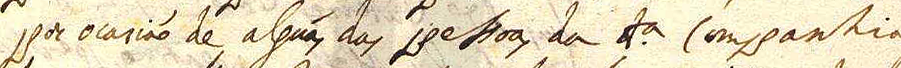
por ocaziaõ de alguās das pessoas da d̄.a Companhia
